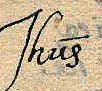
Jhūs
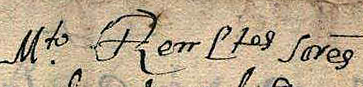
Mto Rem Ltes Sorēs
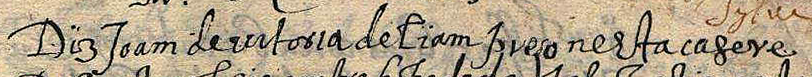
Diz Joam de uitoria de Liam prezo nesta casere
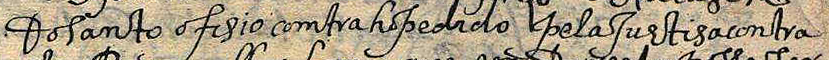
Do santo ofisio comtra ho pedido pela Justisa contra
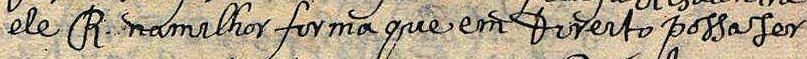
ele R. na milhor forma que em Direito possa ser
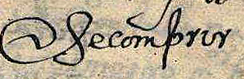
e Se comprir
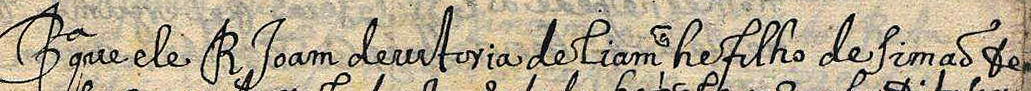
P que elle R Joam de uitoria de Liam he filho de Simaõ De
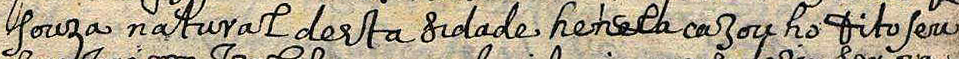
souza naturaL desta sidade he nela cazou ho Dito seu
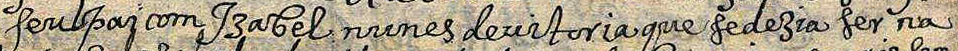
seu pai com Jzabel nunes de uitoria que se dezia ser na
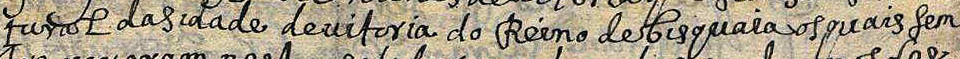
turaL da sidade de uitoria do Reino de bisquaia os quais sem
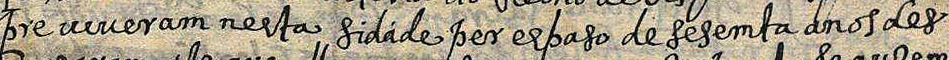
pre uiueram nesta sidade per espaso de sesemta anos des
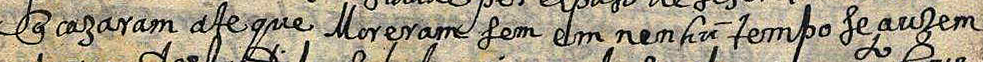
q̄ cazaram ate que Moreram sem em nenhū tempo se auzem
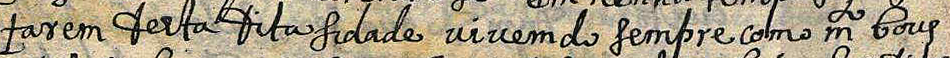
tarem Desta Dita sidade uiuemdo sempre como mto bous
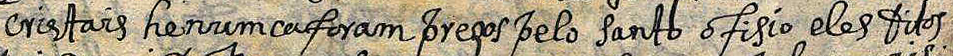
cristais he numca foram prezos pelo santo ofisio eles Ditos
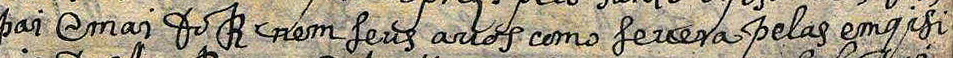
pai e mai Do R nem seus auos como se uera pelas emqisi
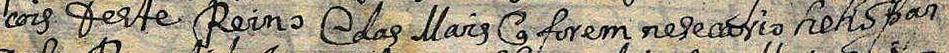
cois Deste Reino e das Mais q̄ forem nesecario he ho pai
